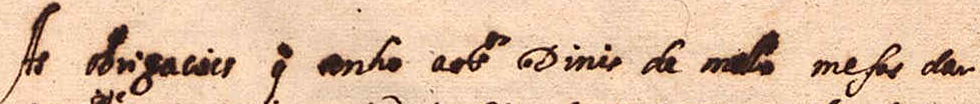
As obrigações q̄ tenho ao sor Dinis de mello me fas dar
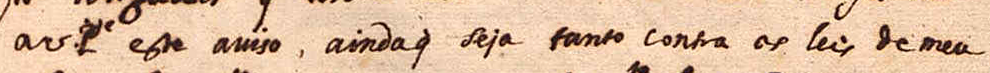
a v. Pe este auiso, ainda q̄ seja tanto contra as leis de meu
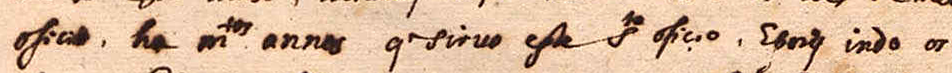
oficio, ha mtos annos q̄ siruo este sto oficio. E porq̄ indo os
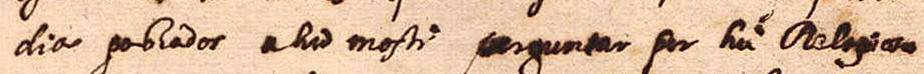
dias passados a hū mostro perguntar por hū Religioso
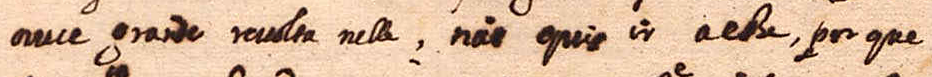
ouue grande reuolta nelle, não quis ir a esse, porque
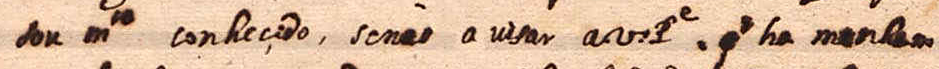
sou mto conhecido, senão auisar a v. Pe q̄ hamanham
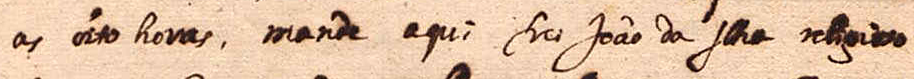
as oito horas, mande aqui frei João da Jlha religioso
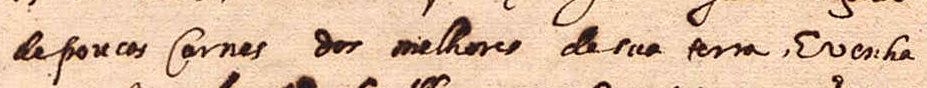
de poucas Carnes dos melhores de sua terra, E venha
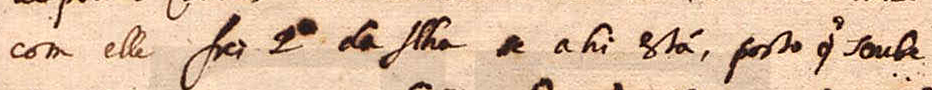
com elle frei Po da Jlha se ahi está, posto q̄ soube
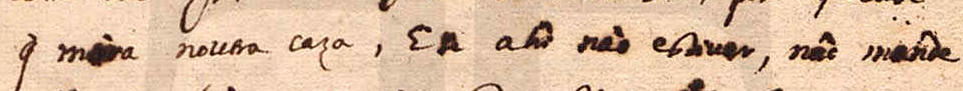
q̄ mora noutra caza, E se ahi naõ estiuer, naõ mande
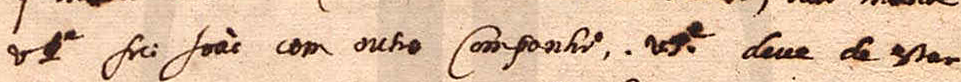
v Pe frei João com outro Companhro, v P.e deue de estar
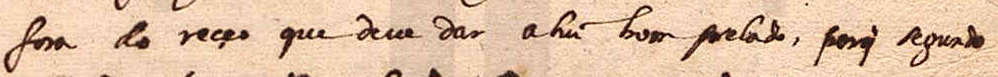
fora do receo que deue dar a hū bom prelado, porq̄ segundo
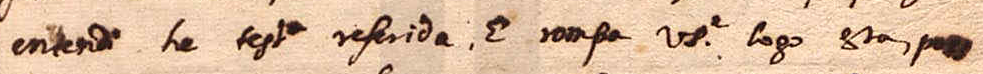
entendi he testa referida, E rompa v P.e logo esta, pois
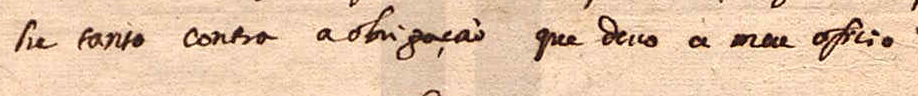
he tanto contra a obrigaçaõ que deuo a meu oficio
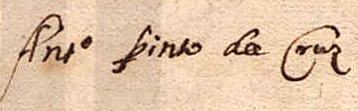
Anto pinto da Cruz
